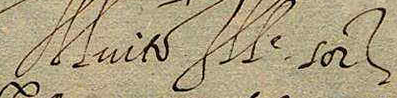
Muito Jlle. sor̄
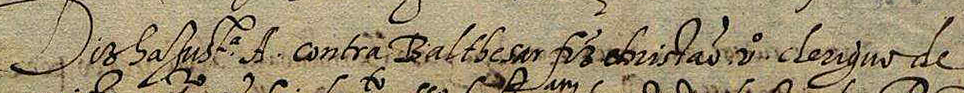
Diz ha Just.a A. contra Balthesar frz̄ christaõ vo. cleriguo de
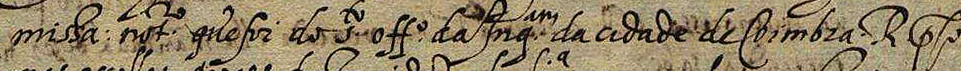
missa not.ro que foi do s.to offo. da Jnq.am da cidade de Coimbra. R p̄so
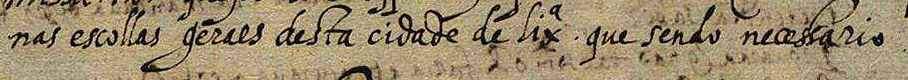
nas escollas geraes desta cidade de lixa. que sendo necessario
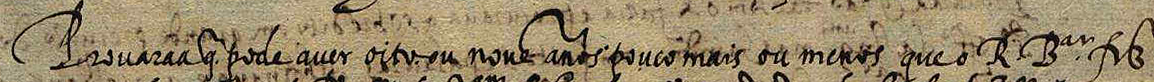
Prouara q̄ pode auer oito ou noue an̄os pouco mais ou menos que o R. Bar. frz̄.
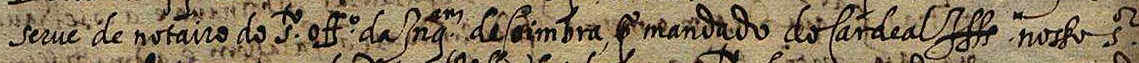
serue de notairo do s.to off.o da Jnq.am de Coimbra, p̄o mandado do Cardeal Jffꝭ nosso sor.
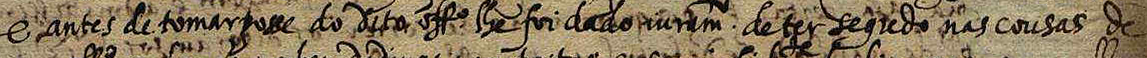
e antes de tomar posse do dito offo lhe foi dado iuram.to de ter segredo nas cousas de
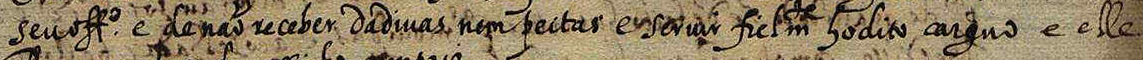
seu off.o e de naõ receber dadiuas nem peitas e seruir fielmte ho dito carguo e elle
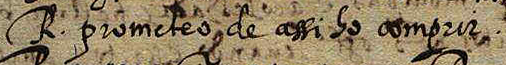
R. prometeo de assi ho comprir.
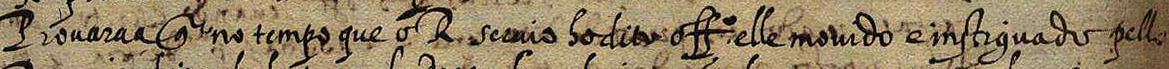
Prouaraa q̄ no tempo que o R seruio ho dito offo. elle mouido e instiguado pello
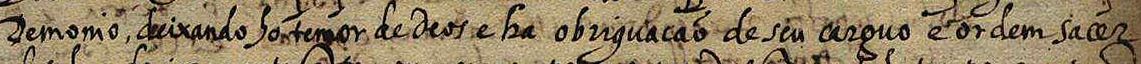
Demonio, deixando ho temor de deos e ha obriguaçaõ de seu carguo e ordem sacer
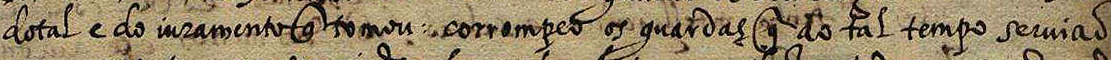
dotal e do iuramento q̄ tomou: corrompeo os guardas q̄ ao tal tempo seruiaõ
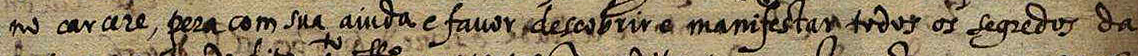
no carcere, pera com sua aiuda e fauor descobrir e manifestar todos os segredos da
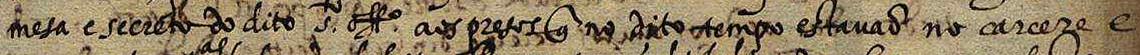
mesa e secreto do dito s.to offo. aos presos q̄ no dito tempo estauaõ no carcere e
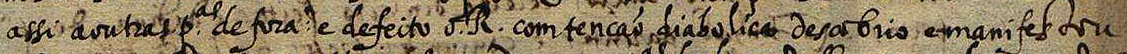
assi a outras p.as de fora e de feito o .R. com tençaõ diabolica descobrio e manifestou
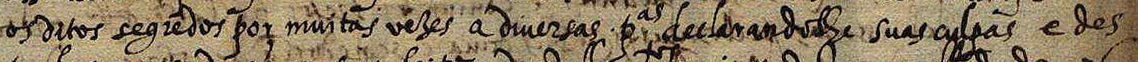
os ditos segredos por muitas vezes a diuersas pas declarandolhe suas culpas e des
